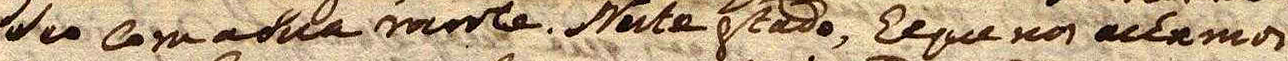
seo com a Sua morte. Neste estado, he que nos achamos
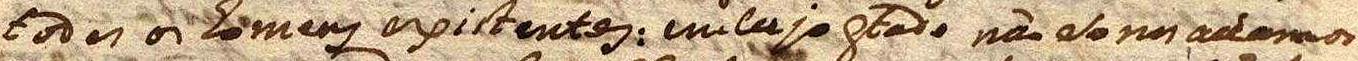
todos os homens existentes: em cujo estado não so nos achamos
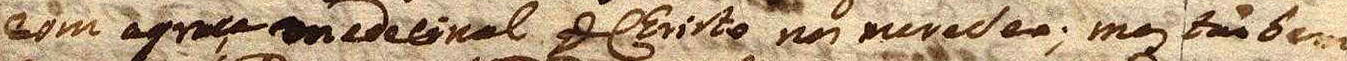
com a graça medecinal q̄ Christo nos mereseo; mas taobem
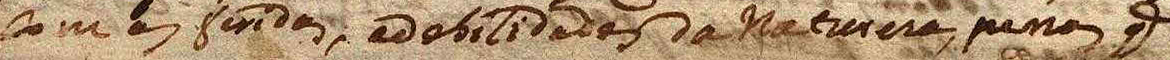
com as feridas, e debilidades da natureza, penas q̄
